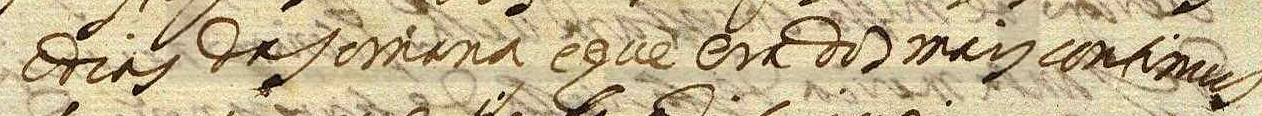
e dias da semana, e que era dos mais continuos
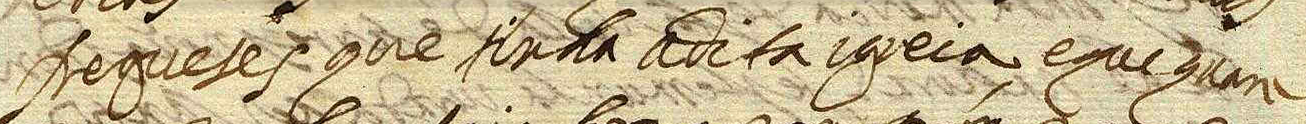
fregueses que tinha a dita igreia, e que quan
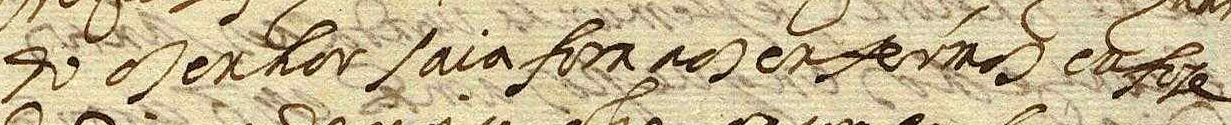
do o senhor saia fora aos enfermos ou fose
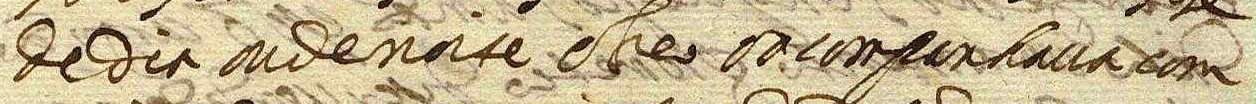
de dia ou de noite o Reo o acompanhaua com
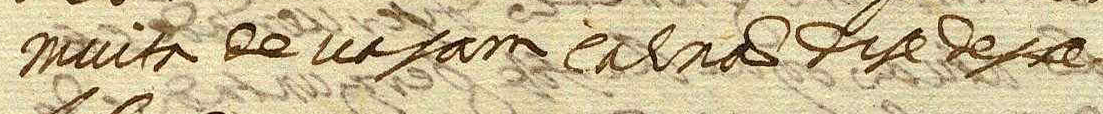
muita deuasam e al naõ dise deste
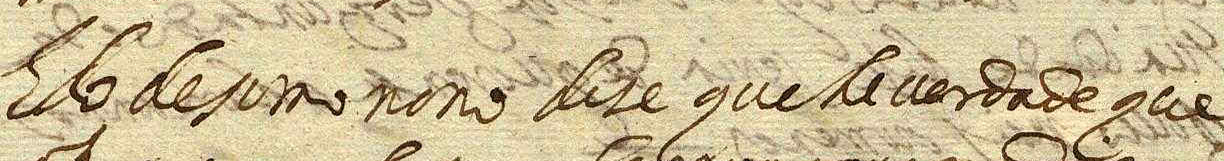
E do desimo nono dise que he uerdade que
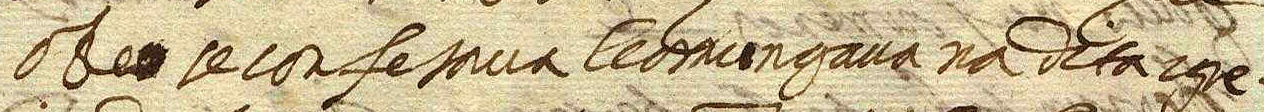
o Reo se confesaua e comungaua na dita igre
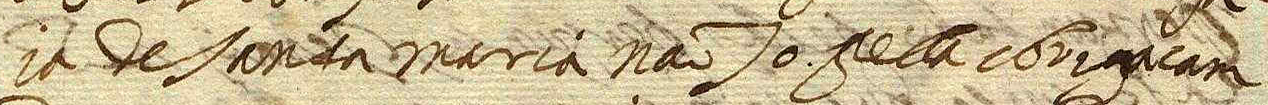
ia de santa maria naõ so pella obrigaçam
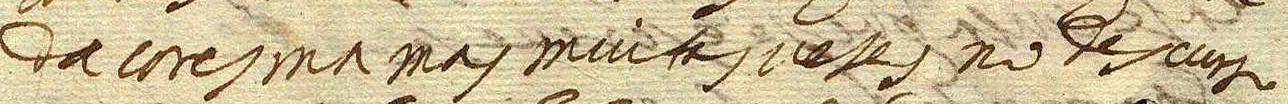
da coresma mas muitas ueses no descurso
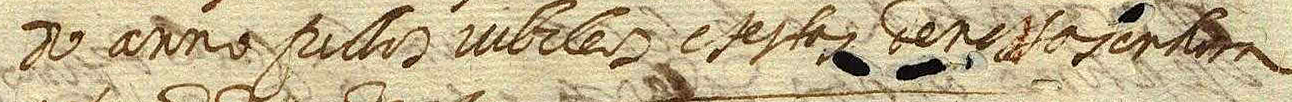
do anno pellos iubeleos e festas de nossa senhora
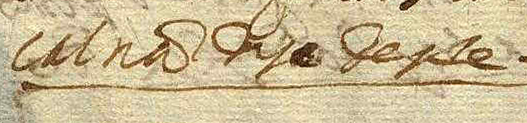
e al naõ dise deste
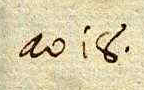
ao i8.
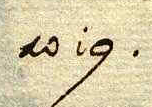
ao i9.
